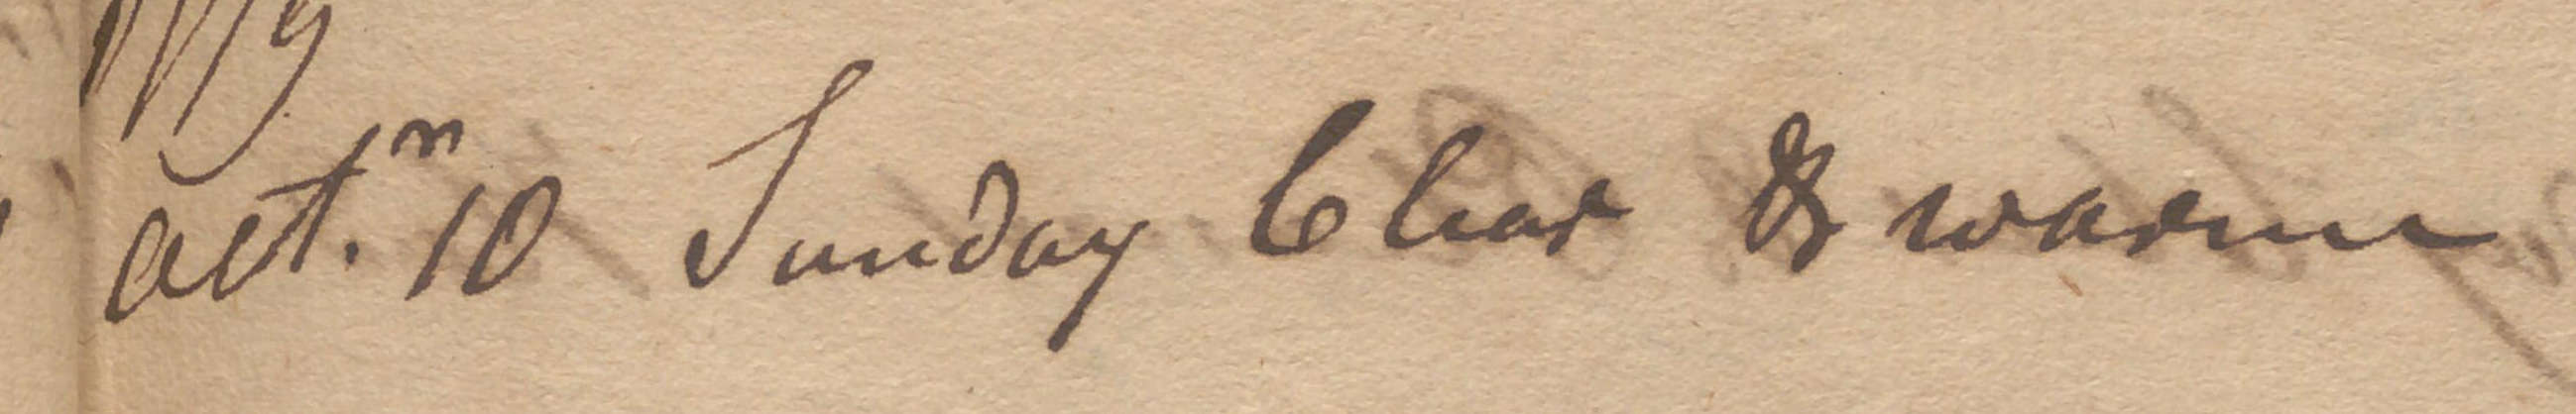Oct^r. 10 Sunday Clear & warm
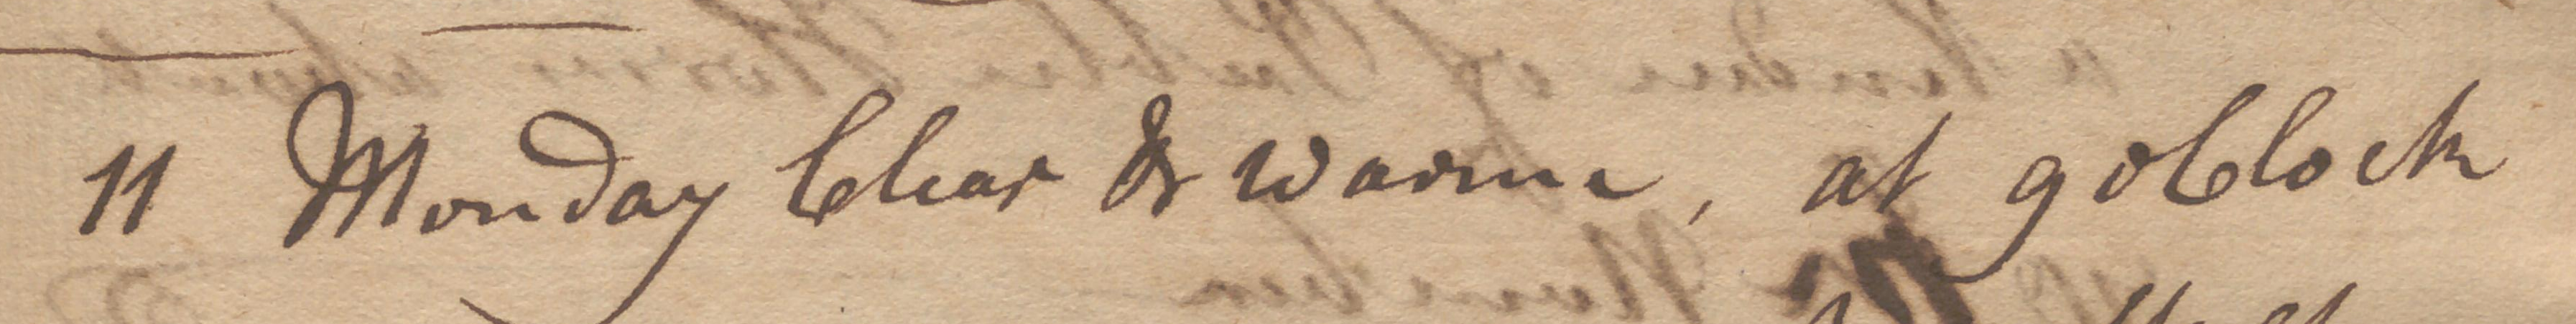11 Monday Clear & Warme, at 9 oClock
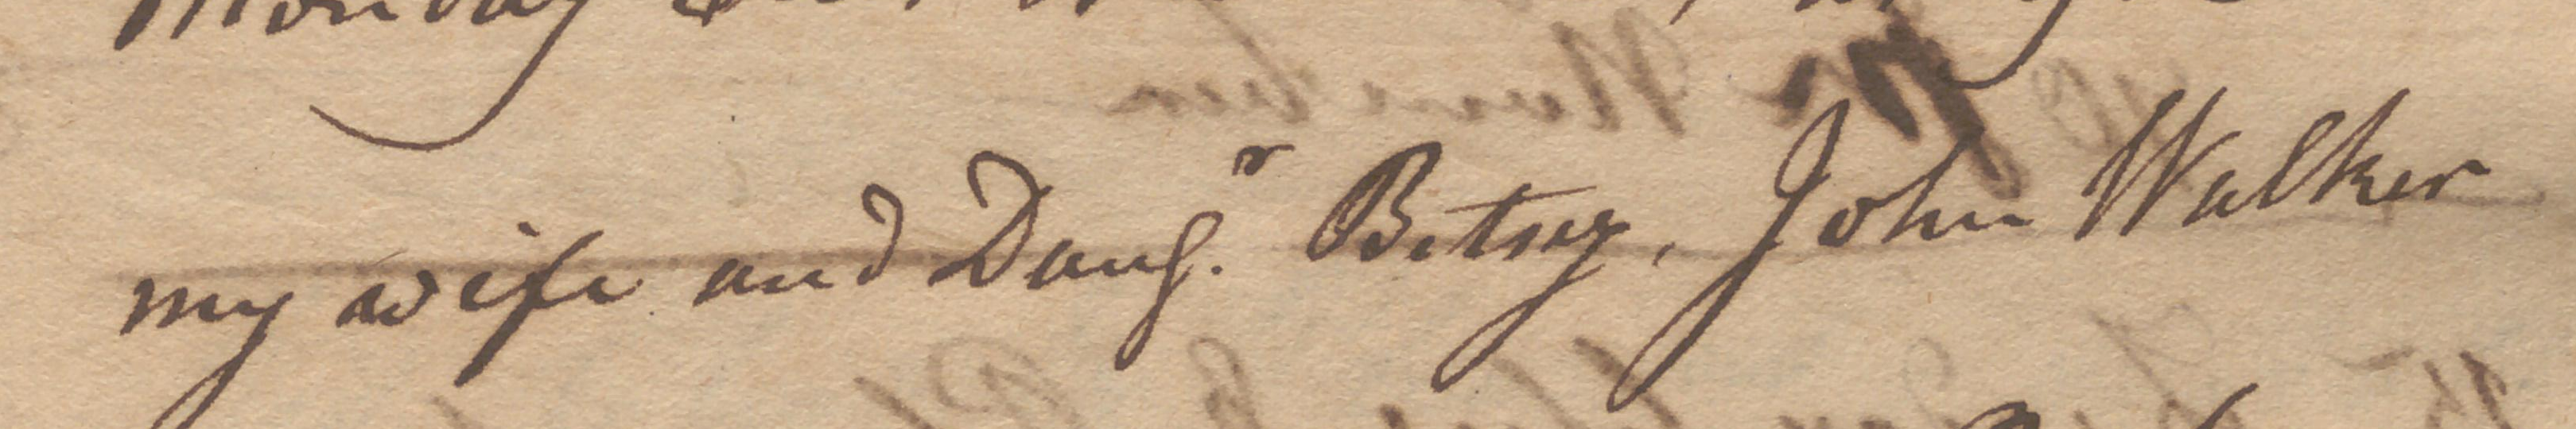my wife and Daug^r. Betsey, John Walker
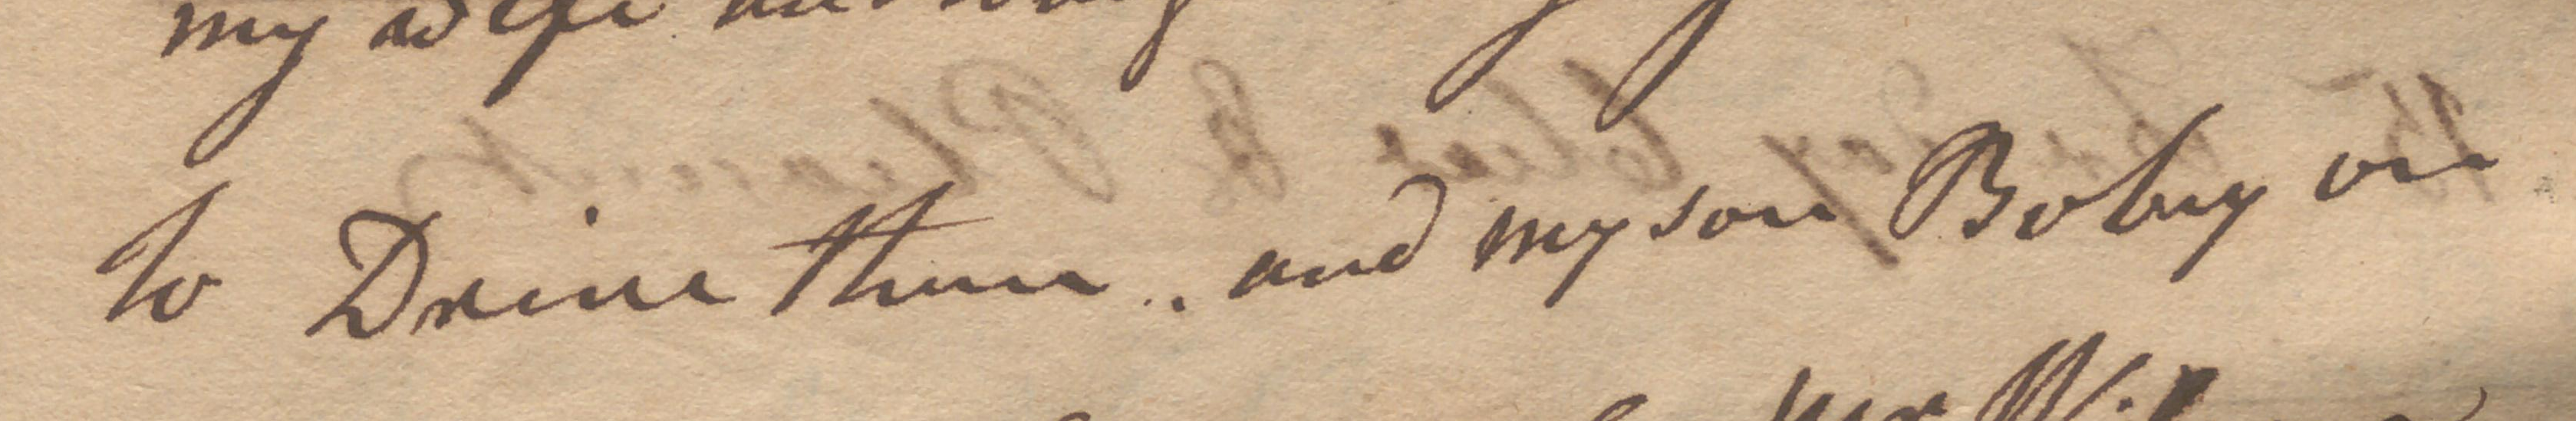to Drive them, and my son Bobey on
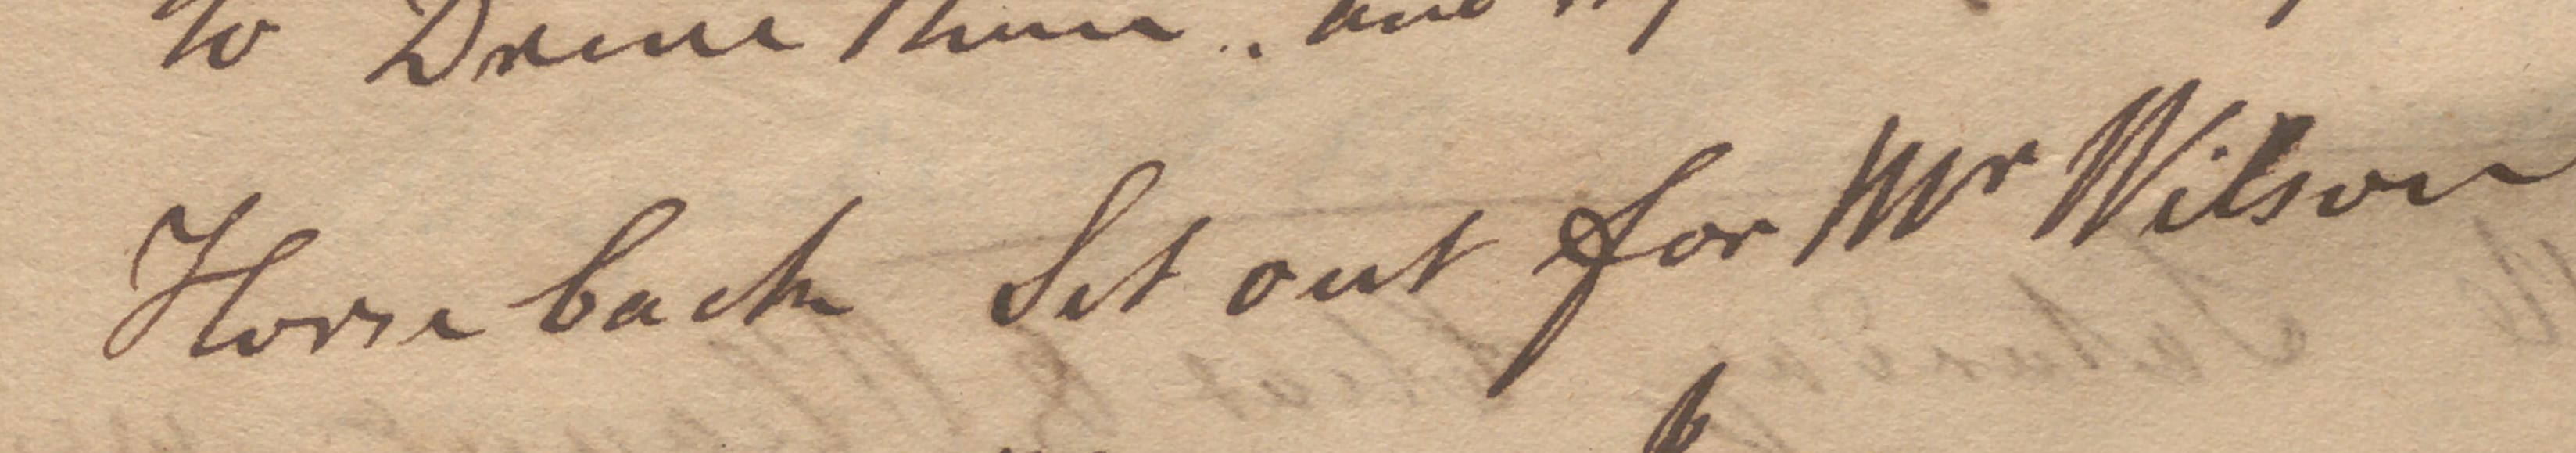Horse back Set out for M^r. Wilson
